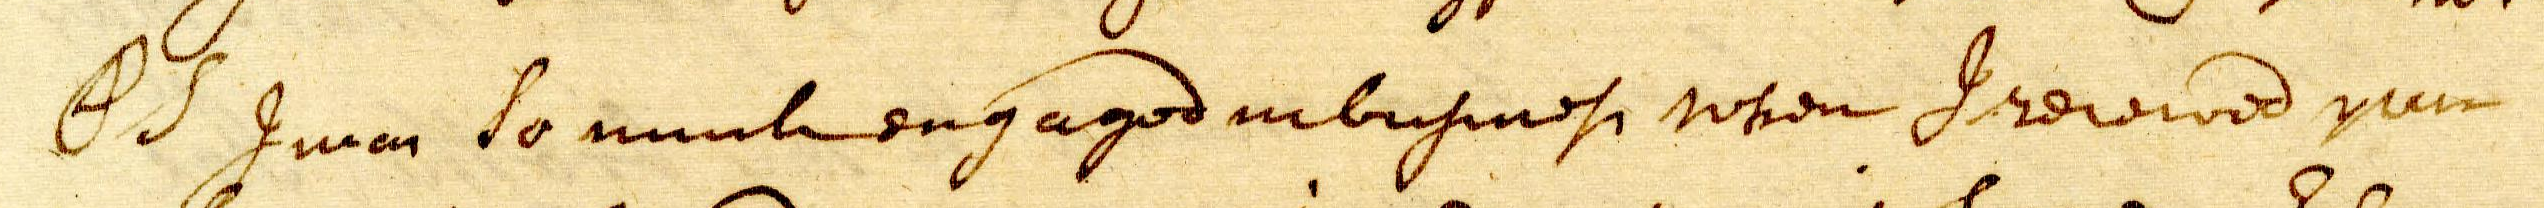PS I was so much engaged in business when I received your
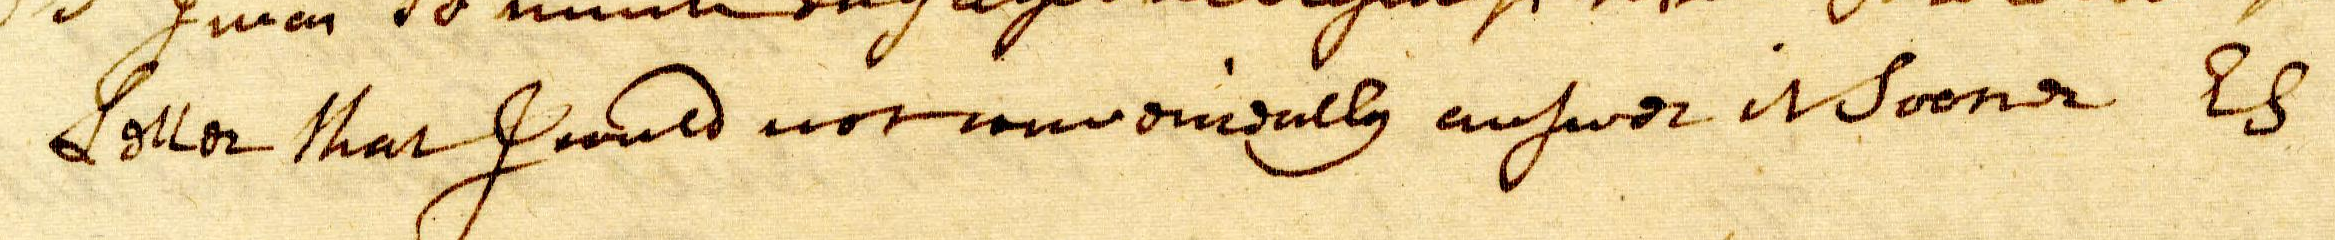Letter that I could not immediedetly answer it Sooner ES
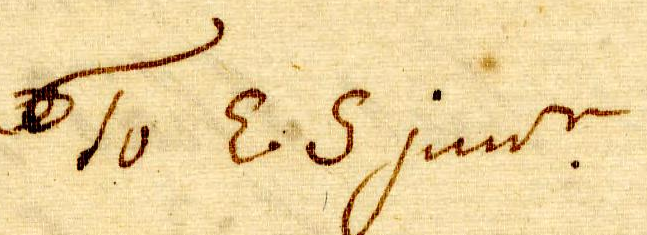To ES jun^r
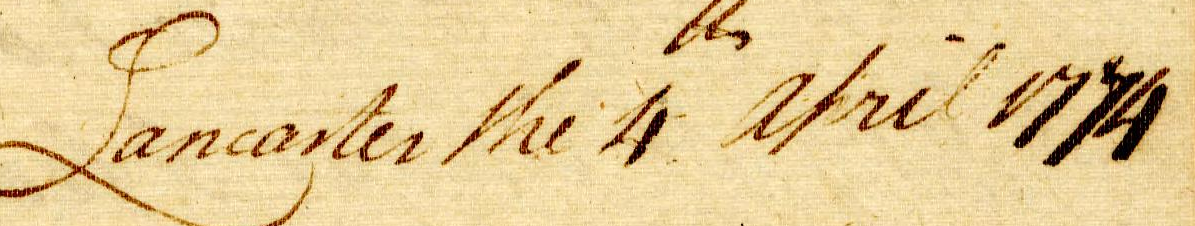Lancaster the 4^th April 1774
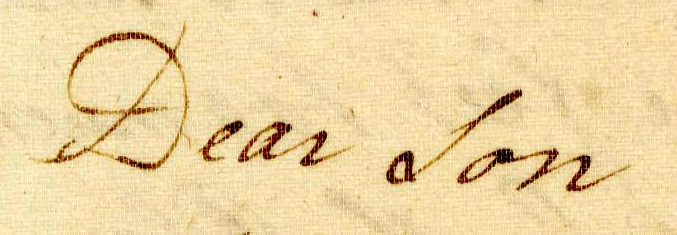Dear Son
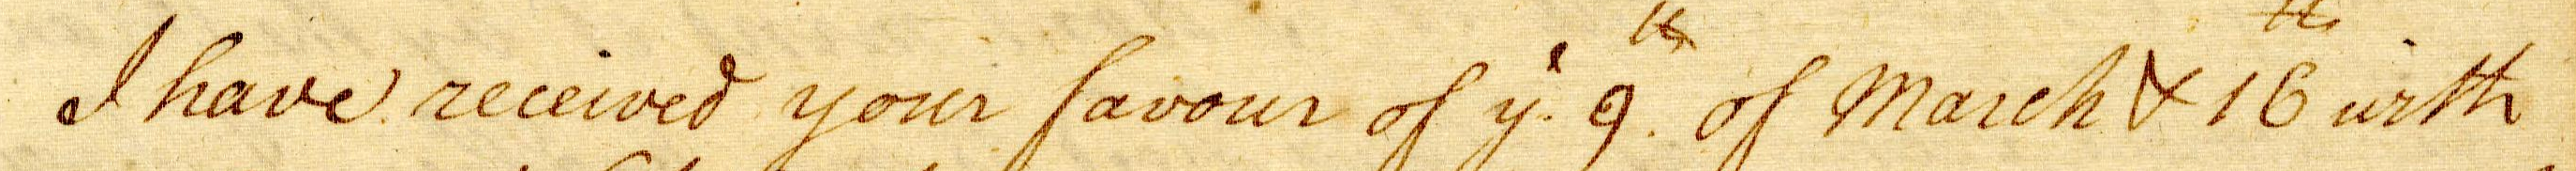I have received your favour of y^e. 9.^th of March the 16^th with
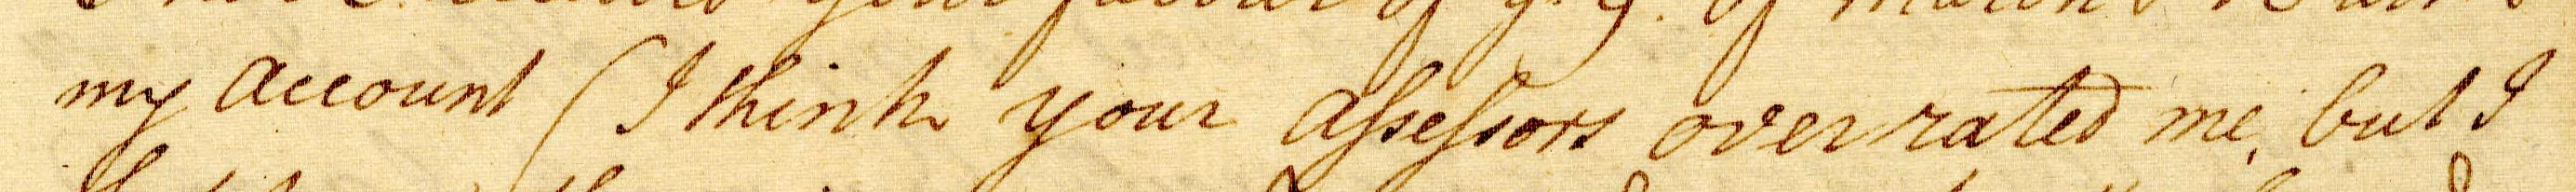my Account (I think your Assessors overrated me, but I
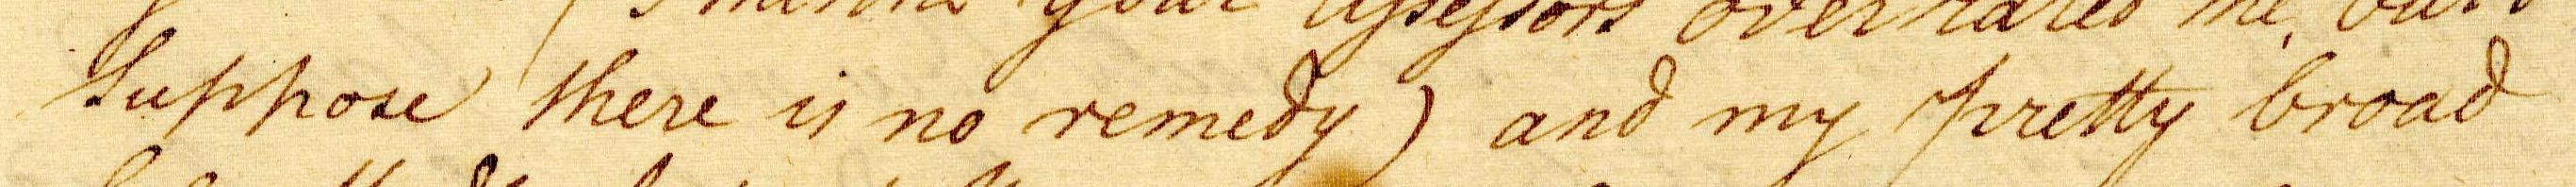Suppose there is no remedy) and my pretty broad
